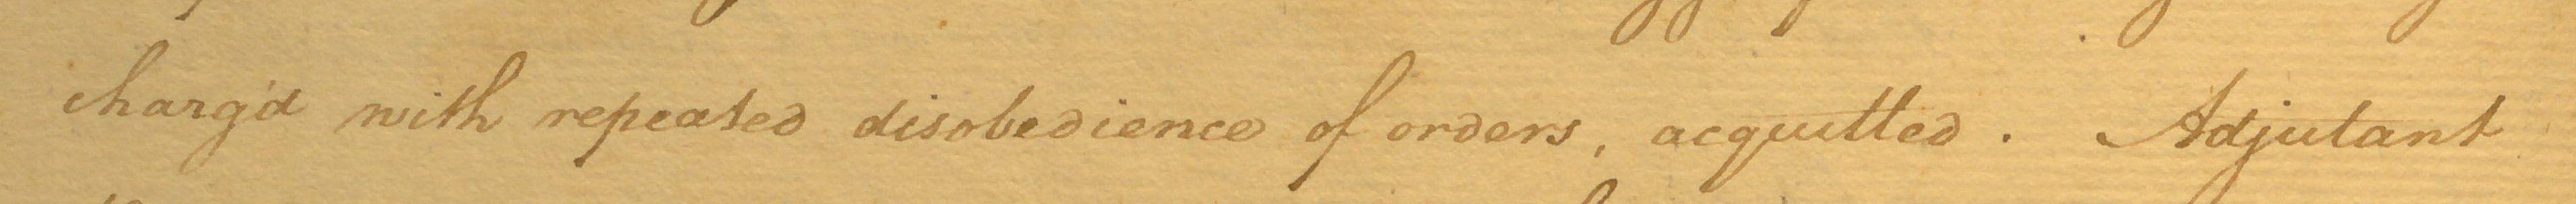charg'd with repeated disobedience of orders, acquitted. Adjutant
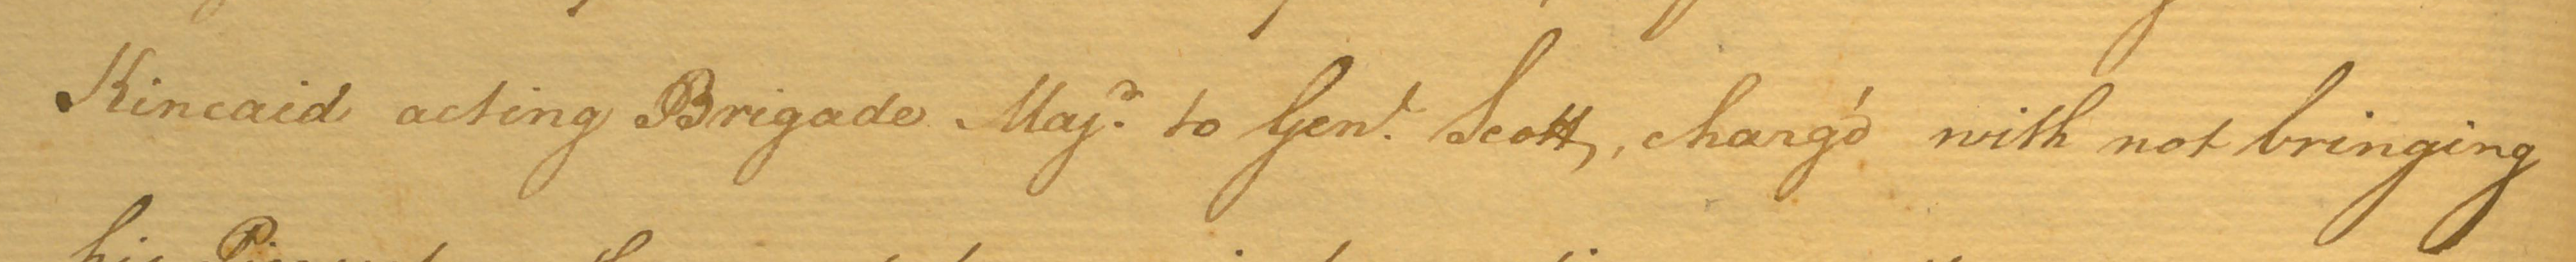Kincaid acting Brigade Maj^r. to Gen^l. Scott, charg'd with not bringing
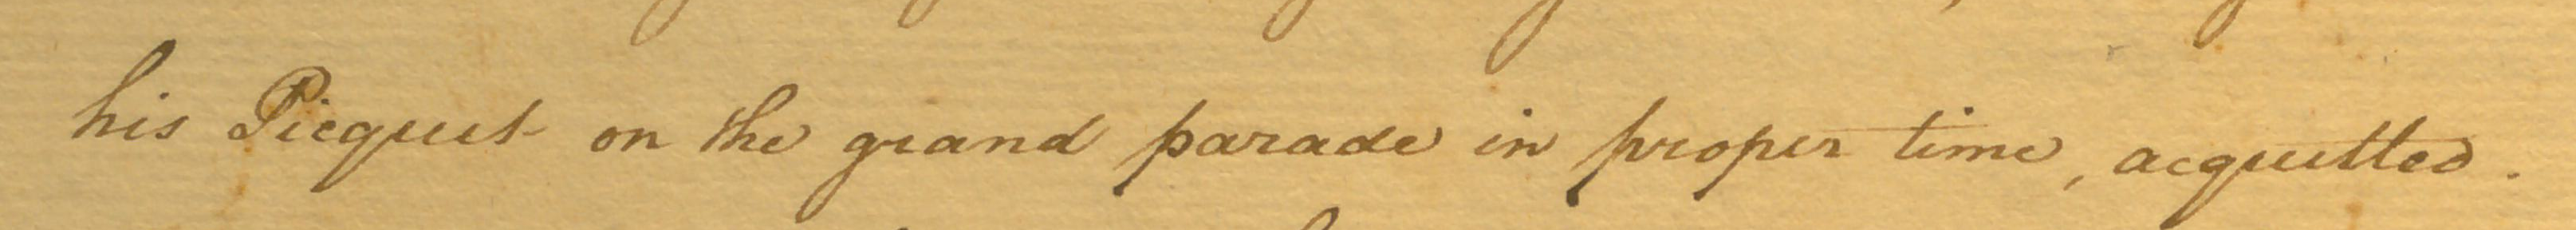his Picquet on the grand parade in proper time, acquitted.
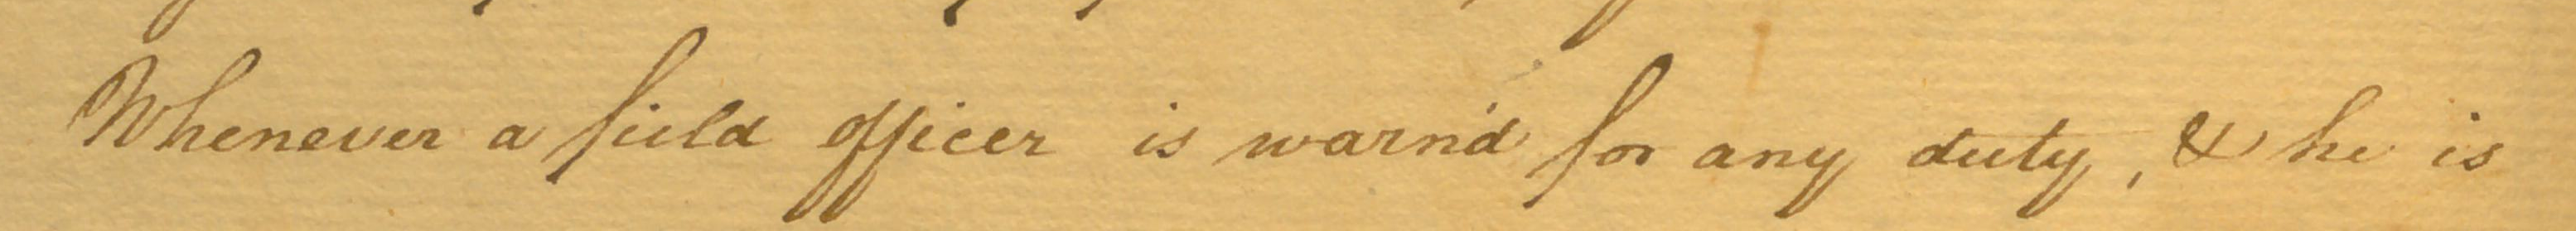Whenever a field officer is warn'd for any duty, & he is
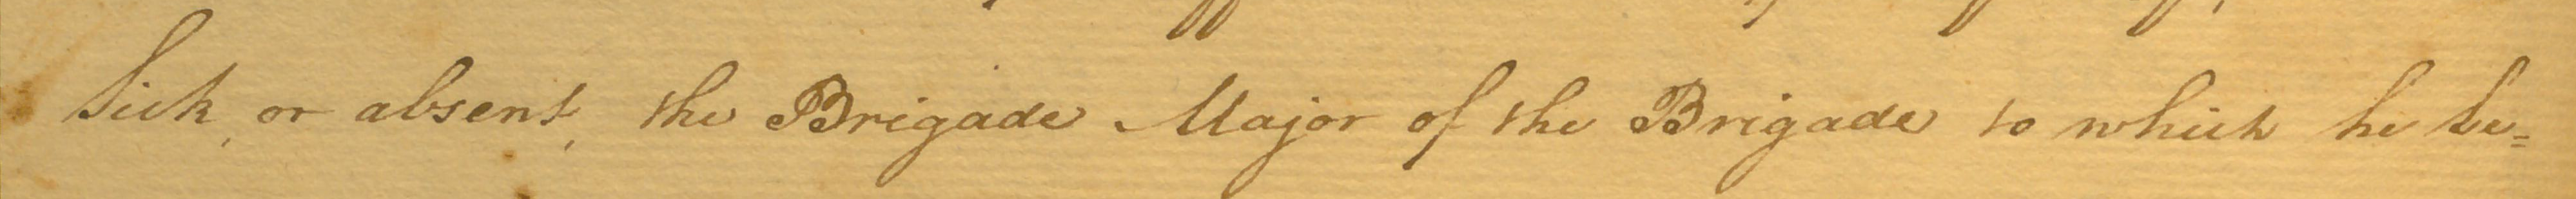Sick or absent, the Brigade Major of the Brigade to which he be-
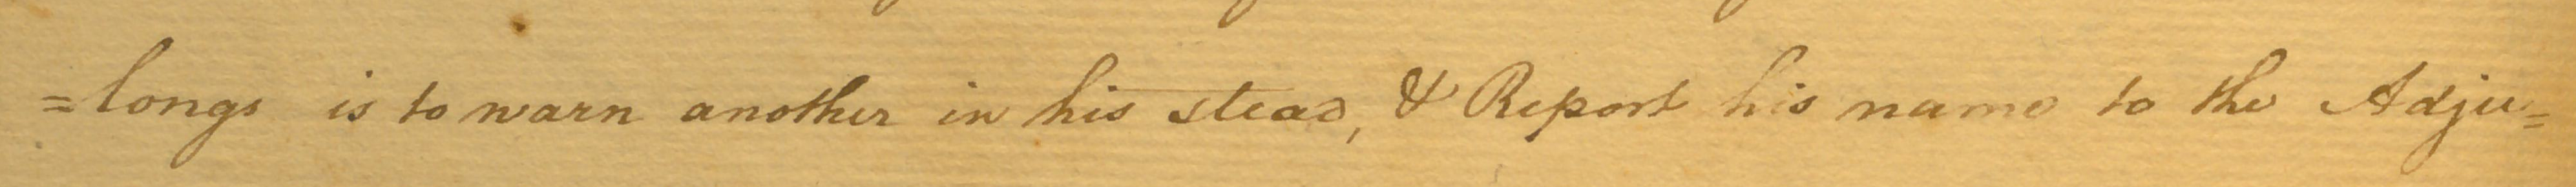-longs is to warn another in his stead, & Report his name to the Adju-
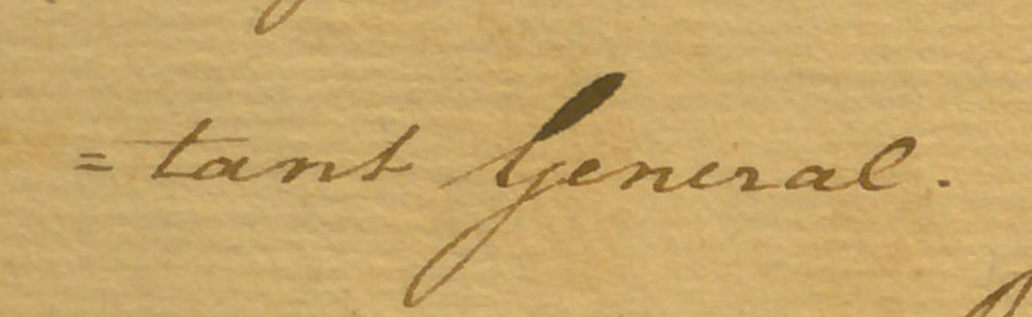-tant General.
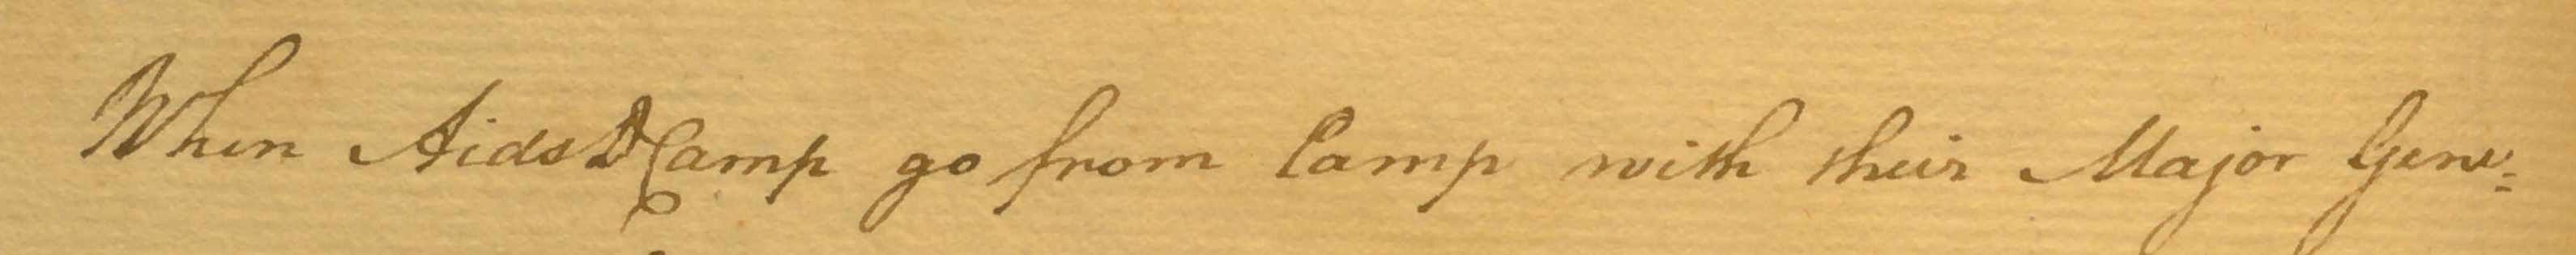When Aids D Camp go from Camp with their Major Gene-
